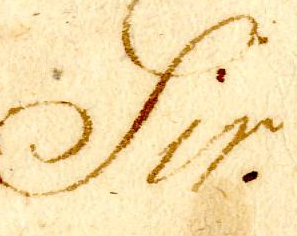Sir
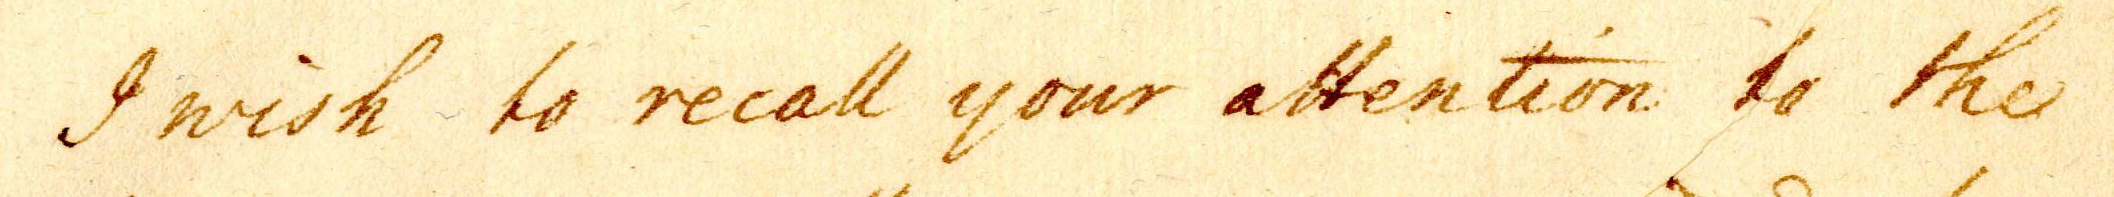I wish to recall your attention to the
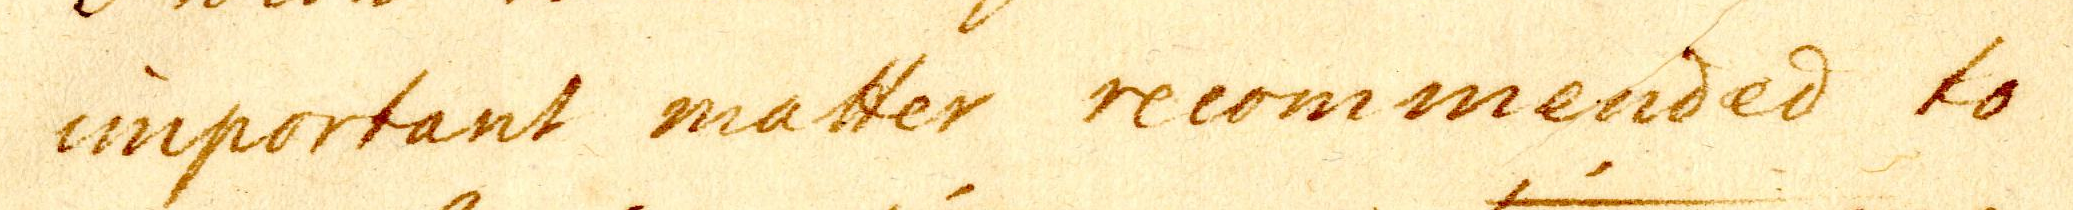important matter recommended to
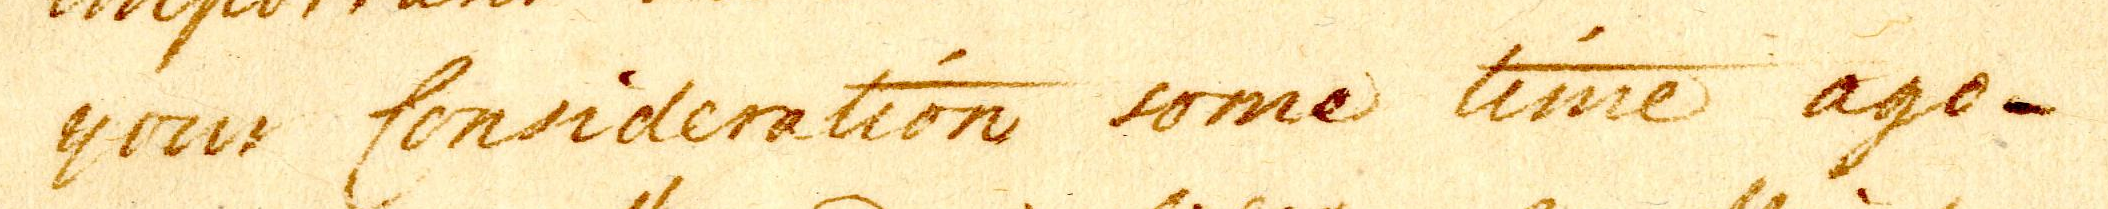your Consideration some time ago-
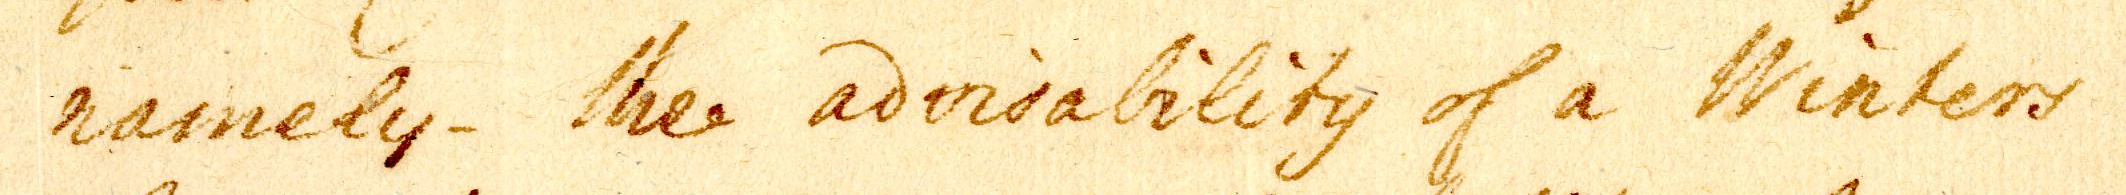namely- the advisability of a Winters
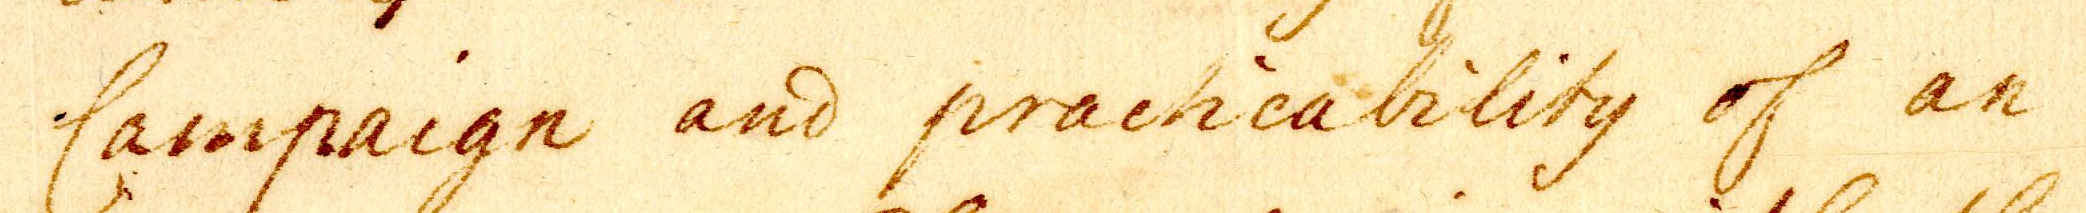Campaign and practicability of an
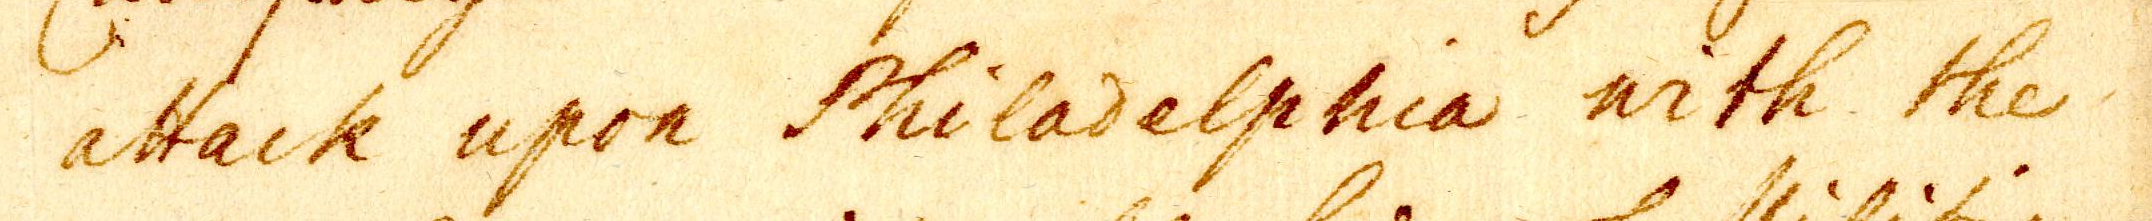attack upon Philadelphia with the
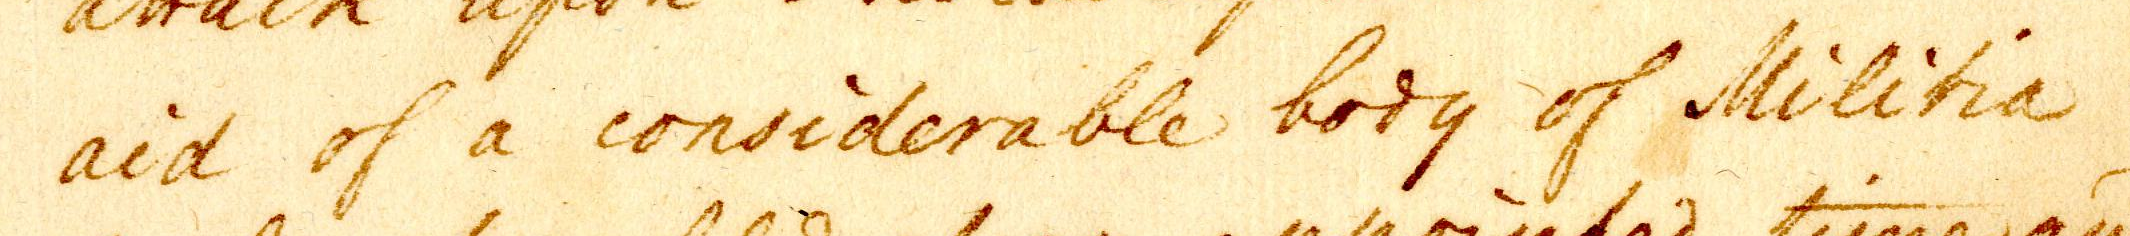aid of a considerable body of Militia
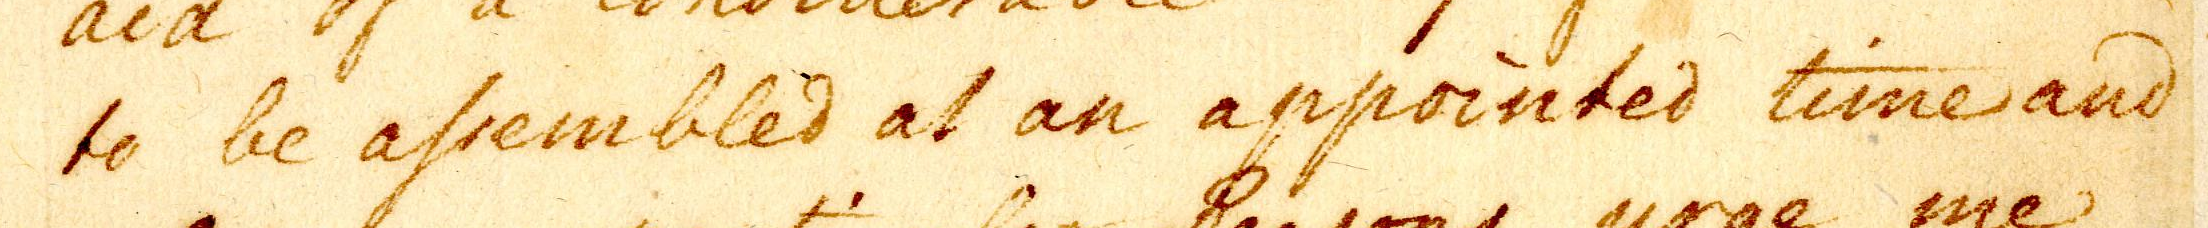to be assembled at an appointed time and
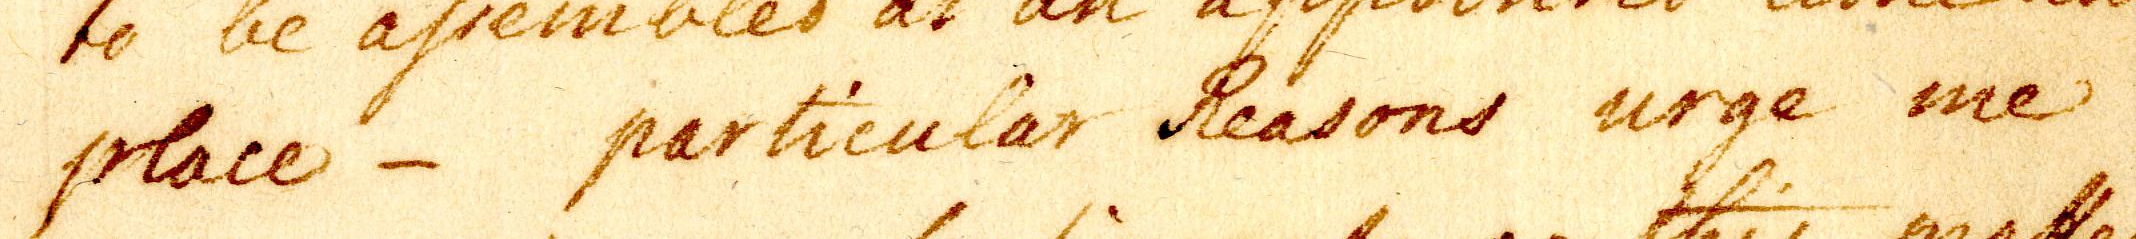place- particular Reasons urge me
